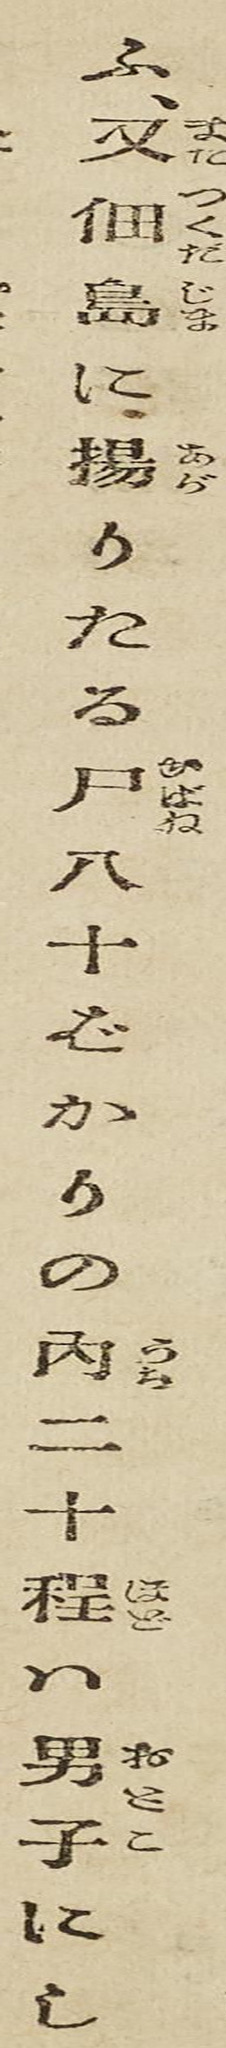ふ、又佃島も揚りたる尸八十ばかりの内二十程は男子にし
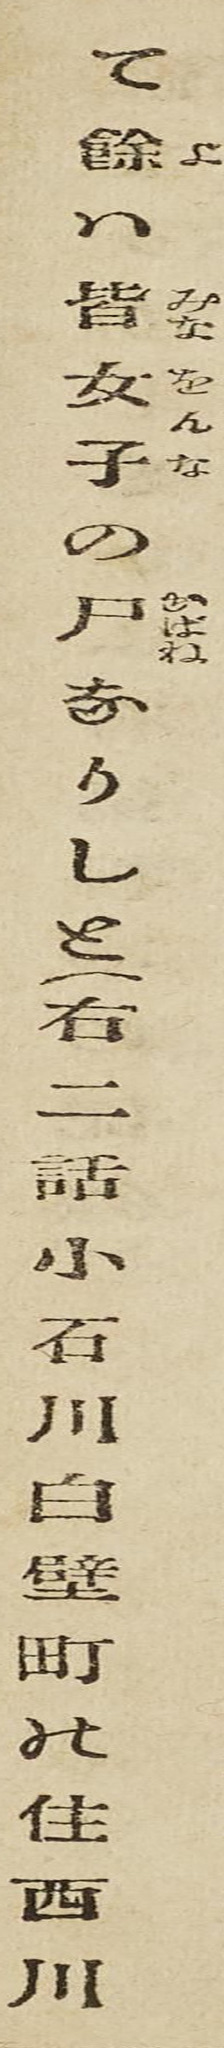て余は皆女子の尸なりしと（右二話小石川白壁町の住西川
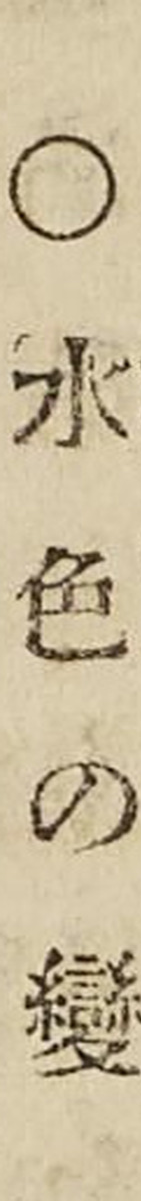○水色の変
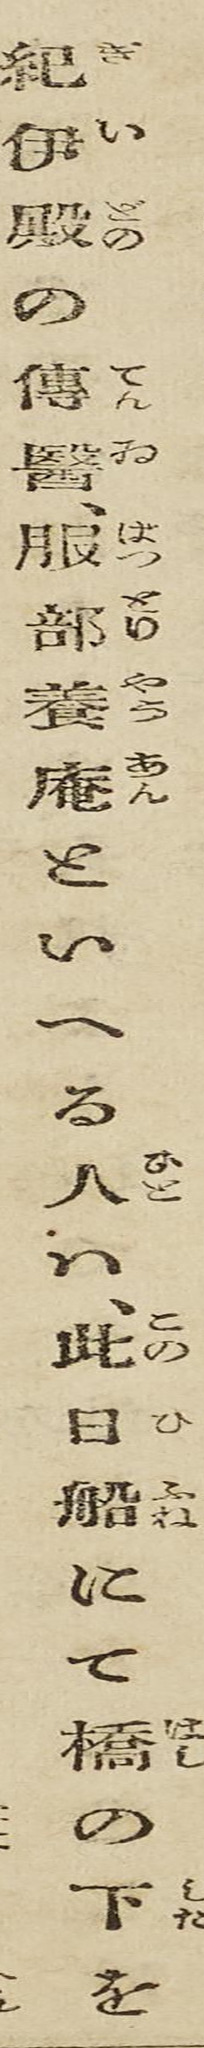紀伊殿の伝医、服部養庵といへる人は、此日船にて橋の下を
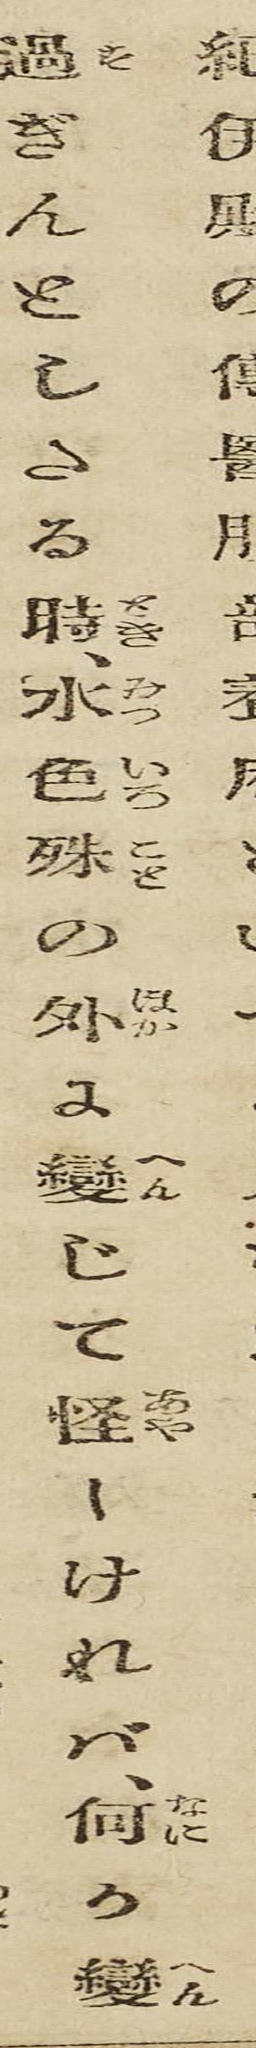過ぎんとしたる時、水色殊の外に変じて怪しければ、何か変
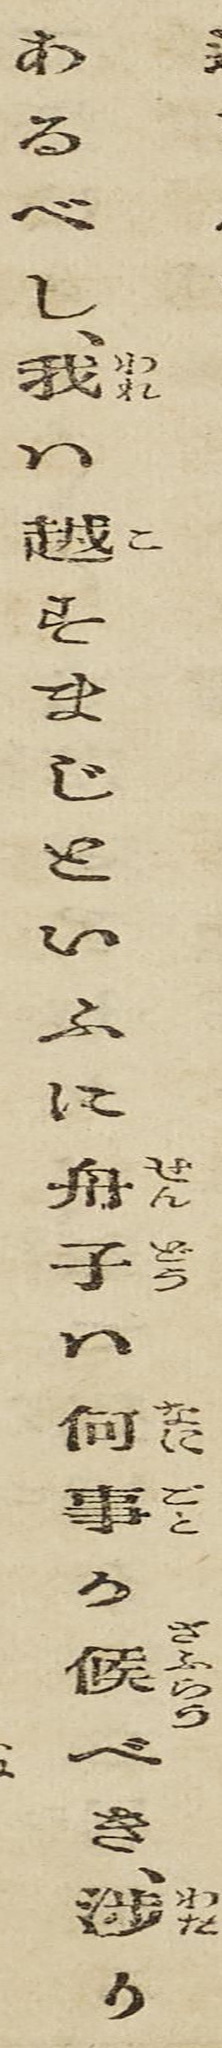あるべし、我は越すまじといふに舟子は何事か候べき、渉り
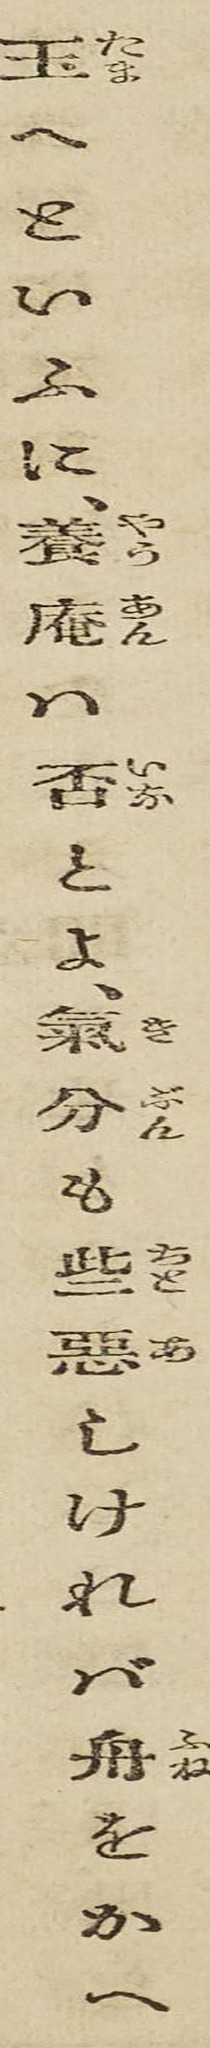玉へといふに、養庵は否とよ、気分も些悪しければ舟をかへ
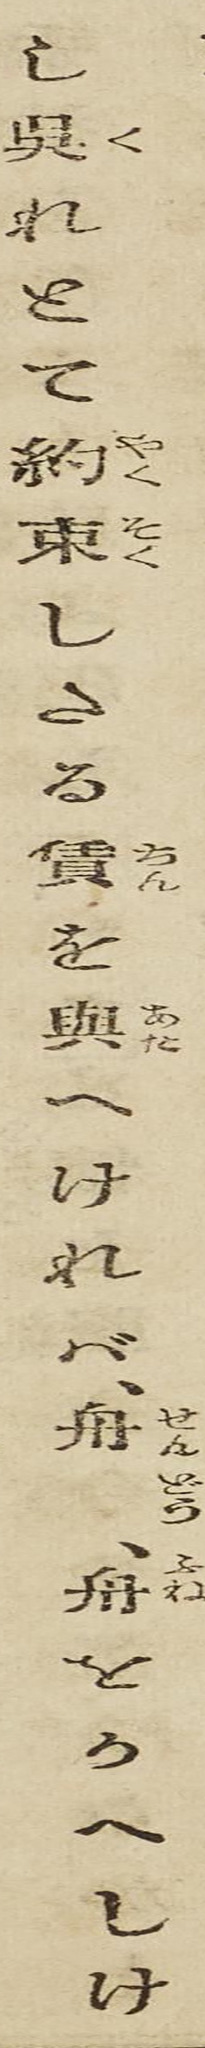し呉れとて約束したる賃を与へければ、舟、舟をかへしけ
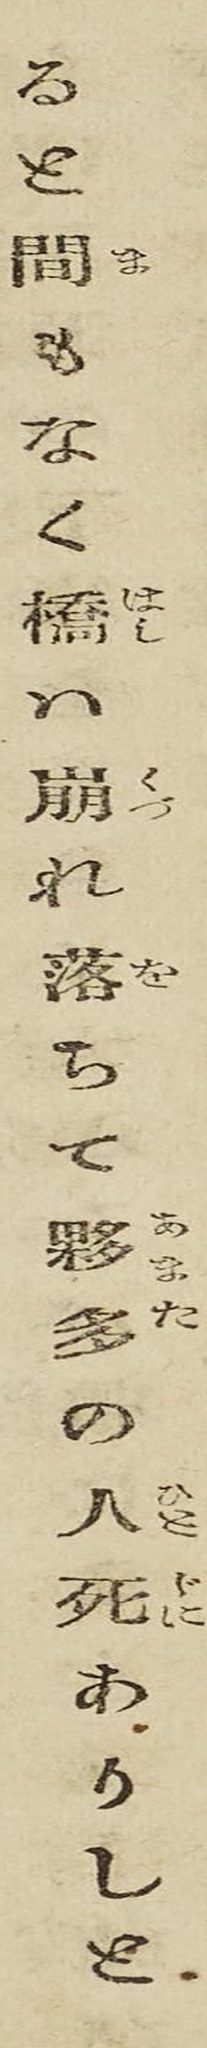ると間もなく橋は崩れ落ちて夥多の人死ありしと
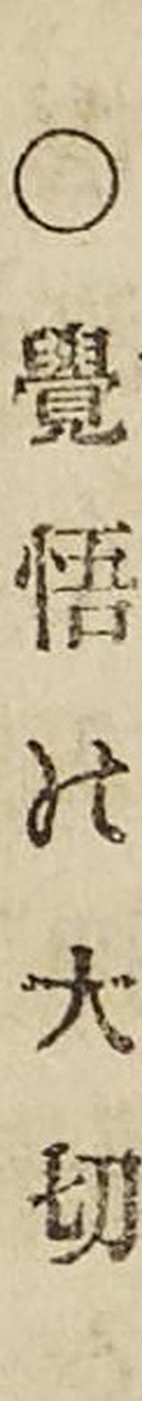○覚悟の大切
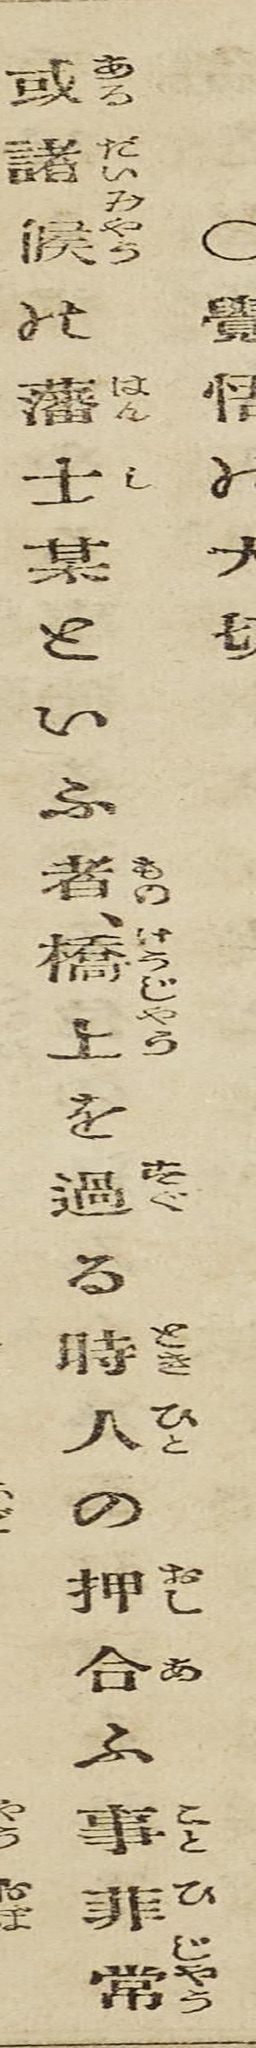或諸侯の藩士某といふ者、橋上を過る時人の押合ふ事非常
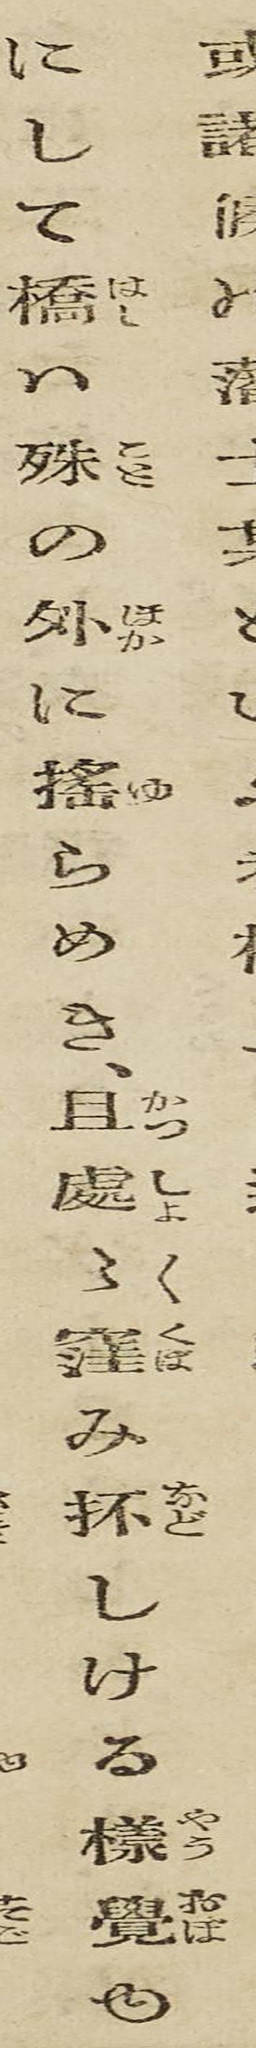にして橋は殊の外に揺らめき、且処〻窪み抔しける様覚ゆ
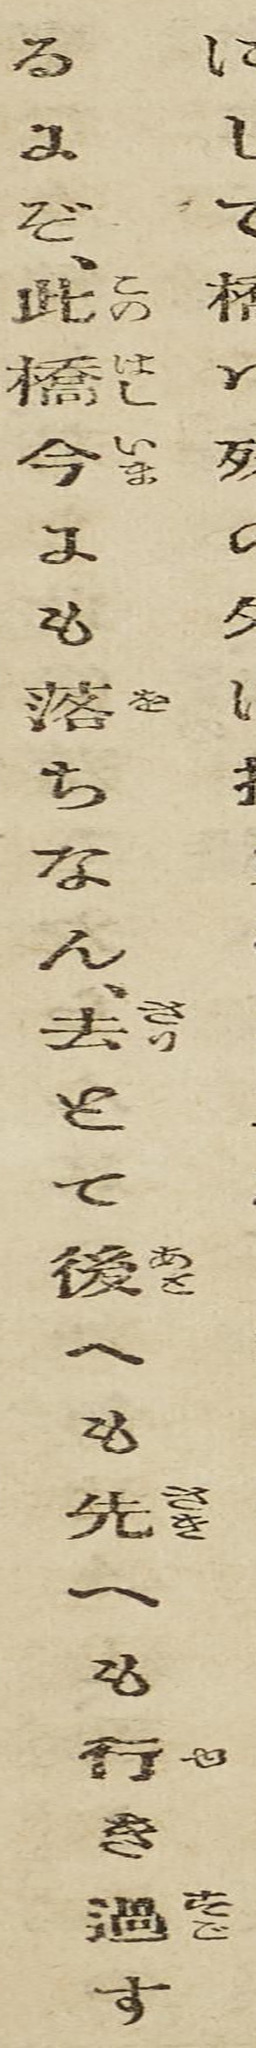るにぞ、此橋今にも落ちなん、去とて後へも先へも行き過す

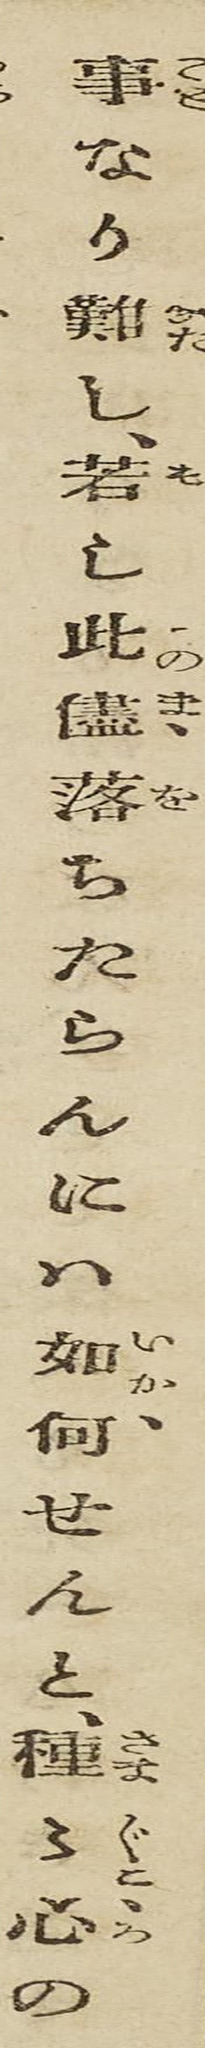事なり難し、若し此侭落ちたらんには如何せんと、種〻心の
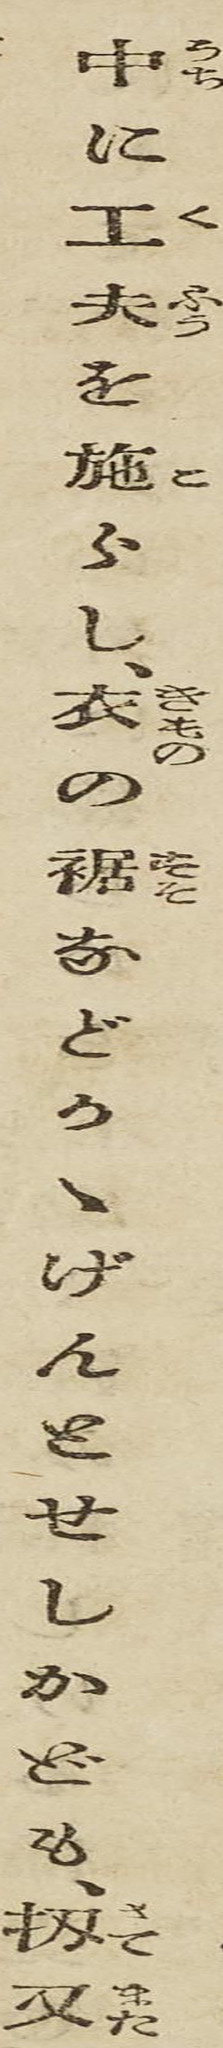中に工夫を施らし、衣の裾などかゝげんとせしかども、扨又
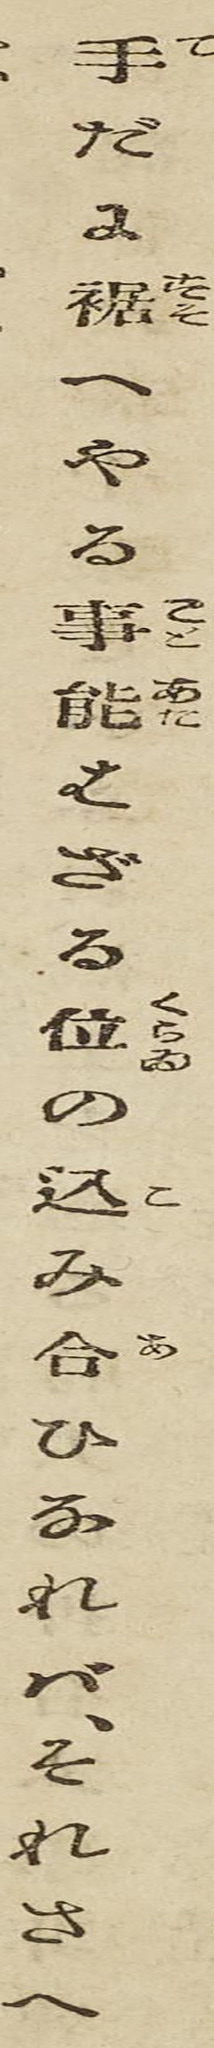手だに裾へやる事能はざる位の込み合ひなれば、それさへ
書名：永代惨話　文化の夢　全
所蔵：東京大学地震研究所図書室 Earthquake Research Institute Library, The University of Tokyo, JAPAN
